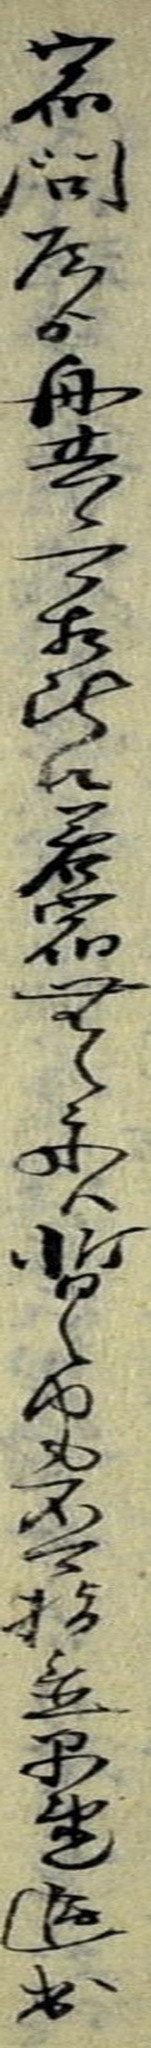宿問屋ゟ舟共へ可相断候若無之舟ハ暫之内も不可指置早速追出
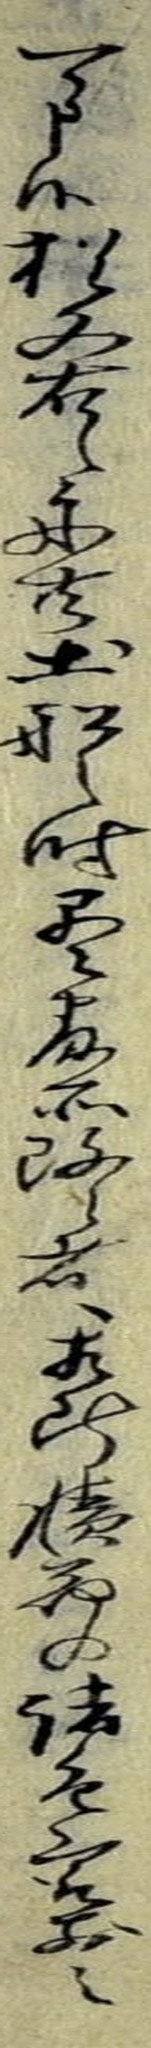可申候猶又右之舟共出船之時早々番所改之者へ相断積荷の諸色最前之
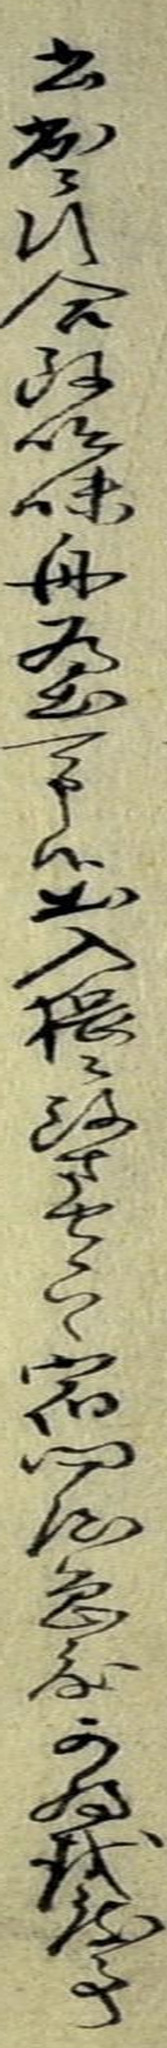書出ニ引合致吟味舟為出可申候出入猥ニ致させ候ハヽ宿問屋急度可為越度事
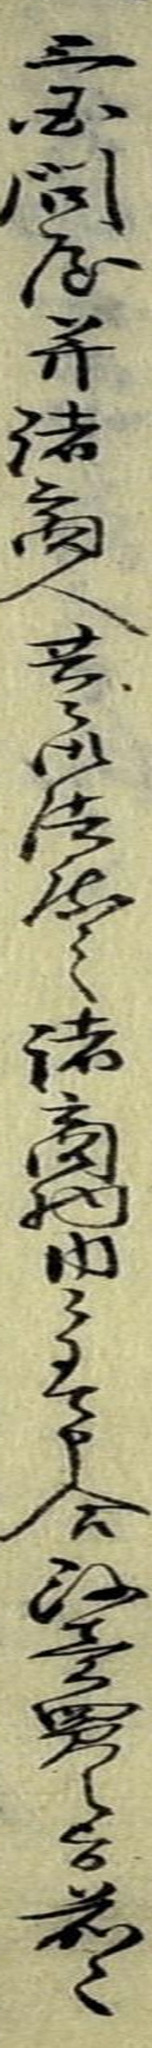一三国問屋并諸商人共ニ御法度之諸商物内々にて申合致売買之旨前々
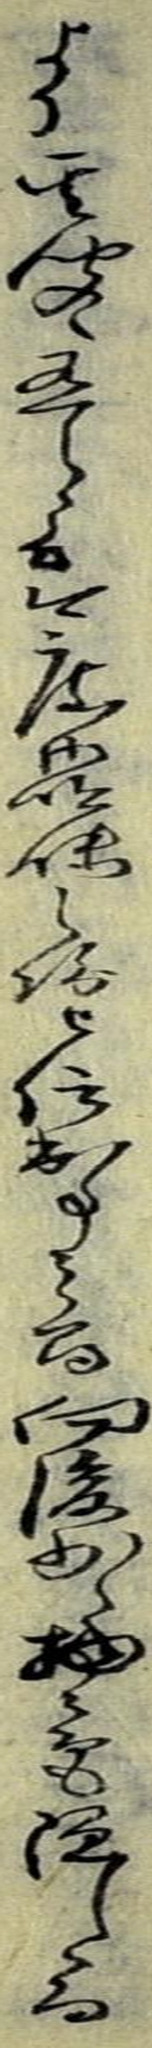より其聞へ有之候付今度御吟味之儀被仰出事ニ候間向後少之物ニ而も隠し候而
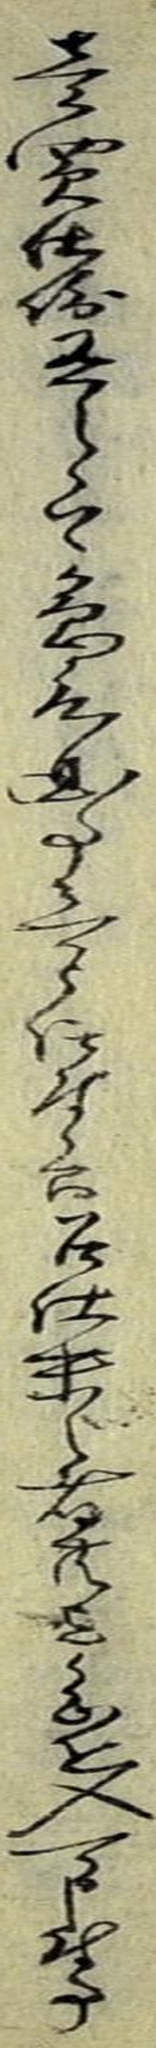売買仕儀有之候ハヽ急度曲事ニ可被仰付候間召仕末之者共迄念を入可申付事
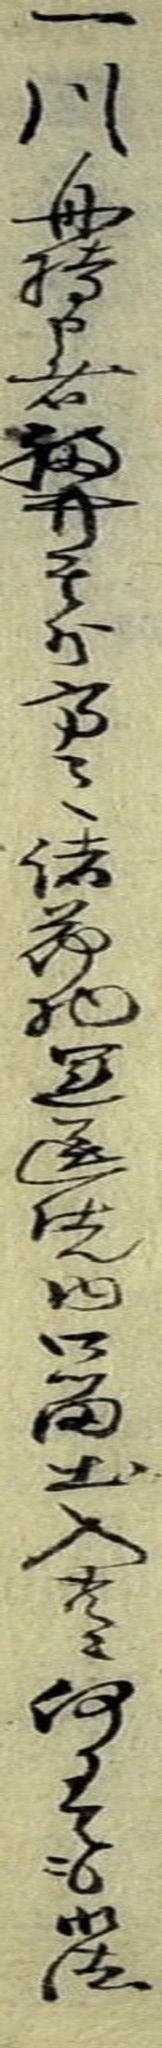一川舟持申者福井其外方々へ諸荷物運送仕ル内口留出入共ニ何にても御法
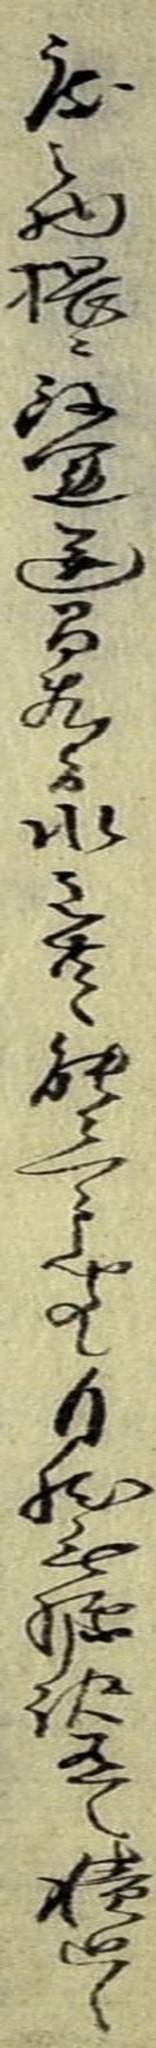度之物猥ニ致運送間敷旨水主共へ能々可申聞候自然無拠訳有之積廻し
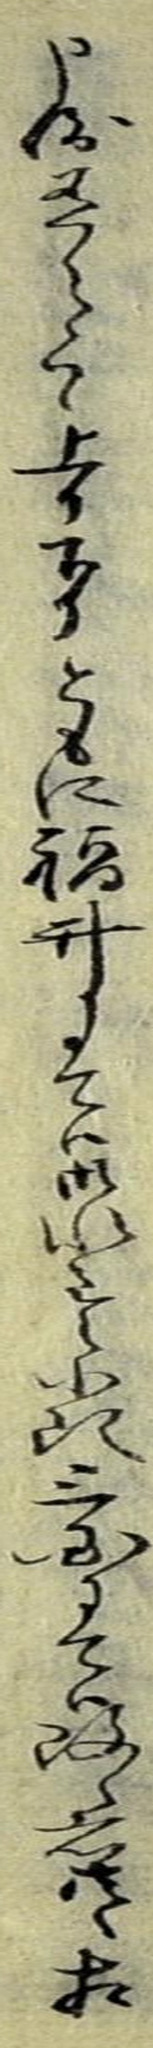申儀有之候ハヽ上り下りともに福井にてハ御水主之小頭三国にてハ改之者共へ相
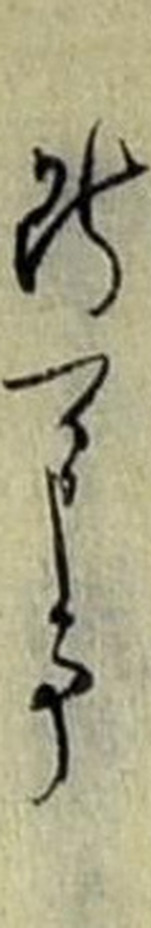断可申事
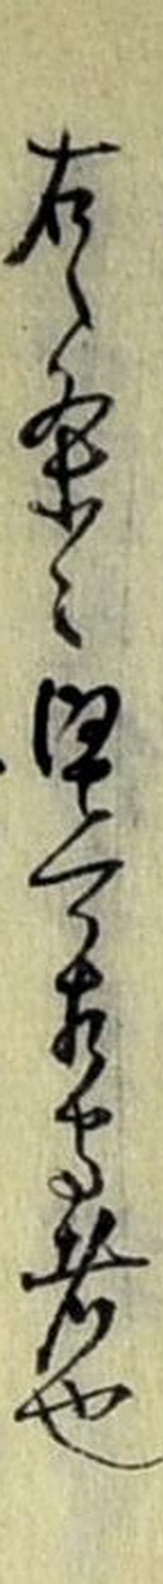右之条々堅可相守者也
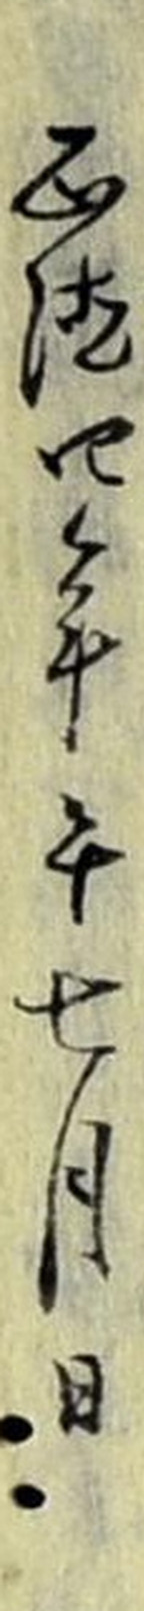正徳四年午七月日

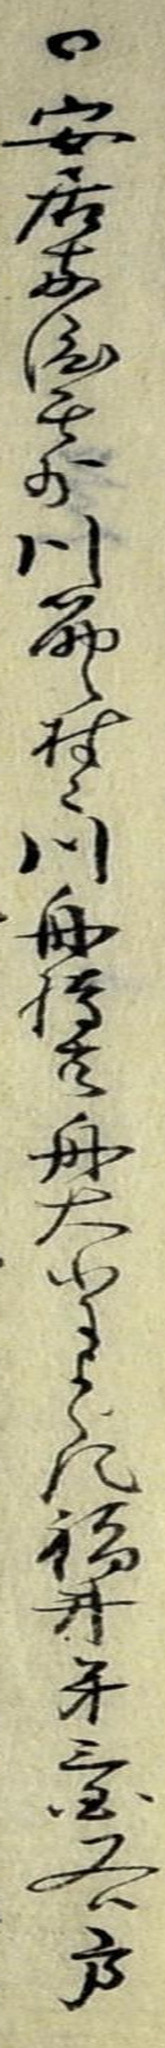〇安居両渡其外川筋之村々川舟持共舟大小によらす福井并三国又ハ方
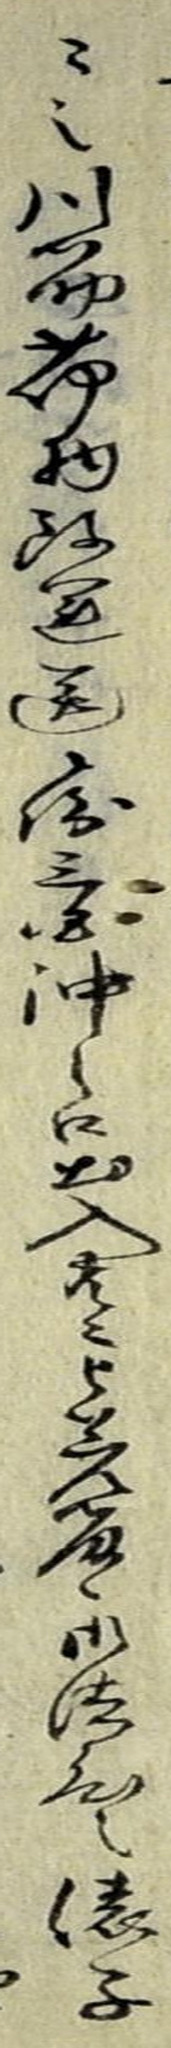々之川筋荷物致運送候儀三国沖之口出入共ニ被差留候御法度之俵子
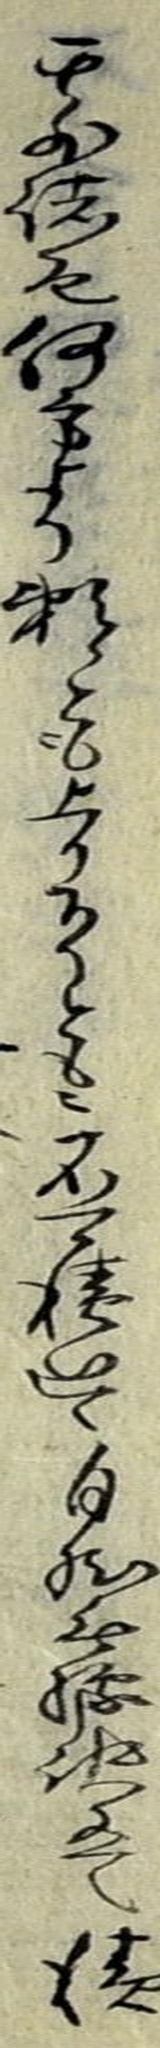其外諸色何方より頼候ともの上り下りともニ不可積廻候自然無拠訳有之積
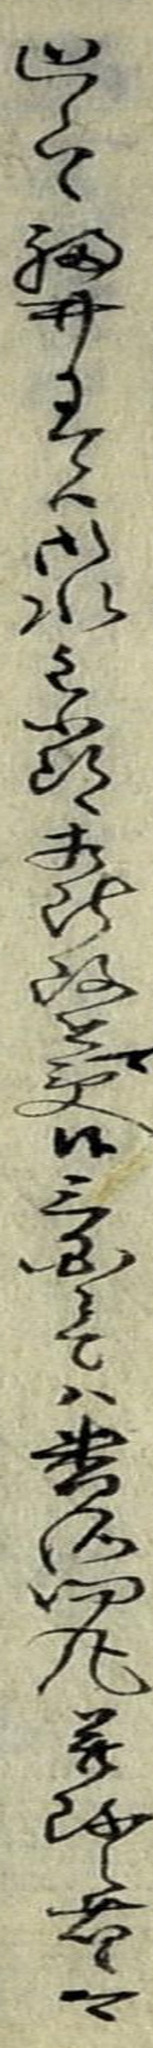廻候ハヽ福井にてハ御水主頭へ相断改を可受候三国にてハ番所問丸并改之者へ可
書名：命令之部 一
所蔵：福井県文書館 Fukui Prefectural Archives
